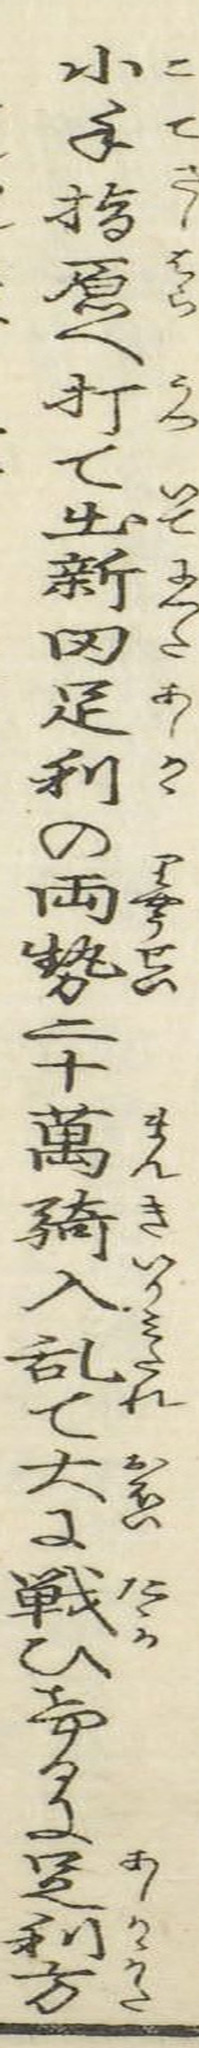小手指原へ打て出新田足利の両勢二十万騎入乱て大に戦ひけるに足利方
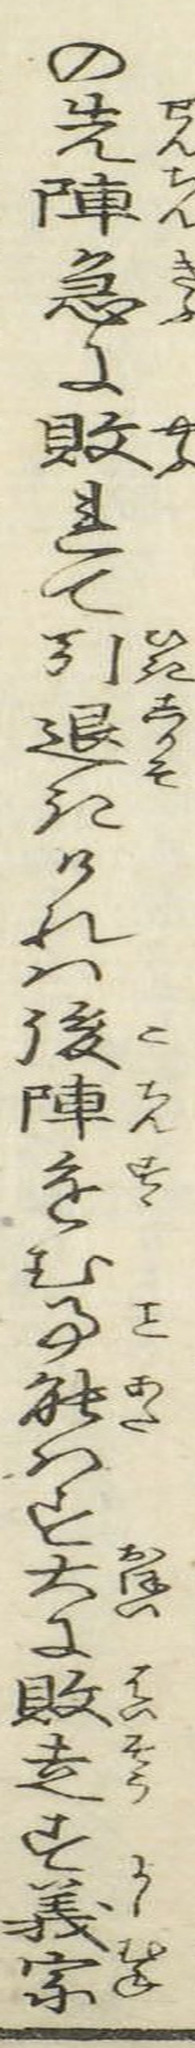の先陣急に敗れて引退きけれは後陣進む事能はす大に敗走す義宗
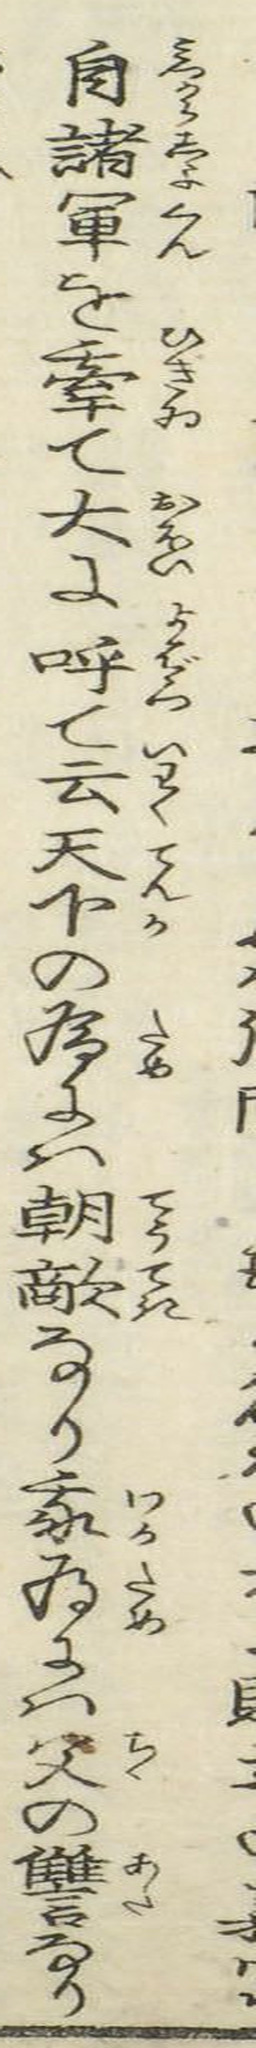自諸軍を牽て大に呼て云天下の為には朝敵なり我為には父の讐なり
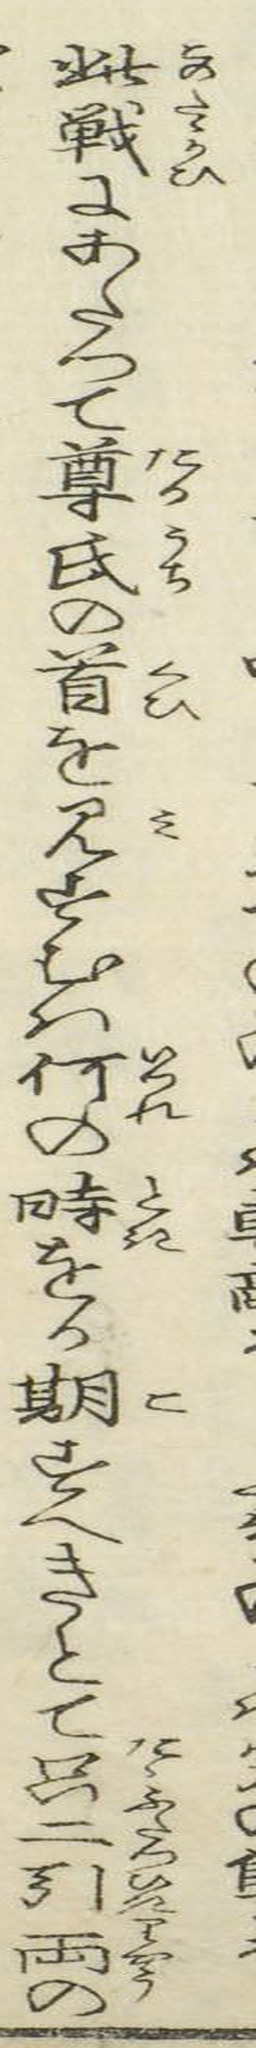此戦にあたつて尊氏の首を見すむは何の時をか期すへきとて只二引両の
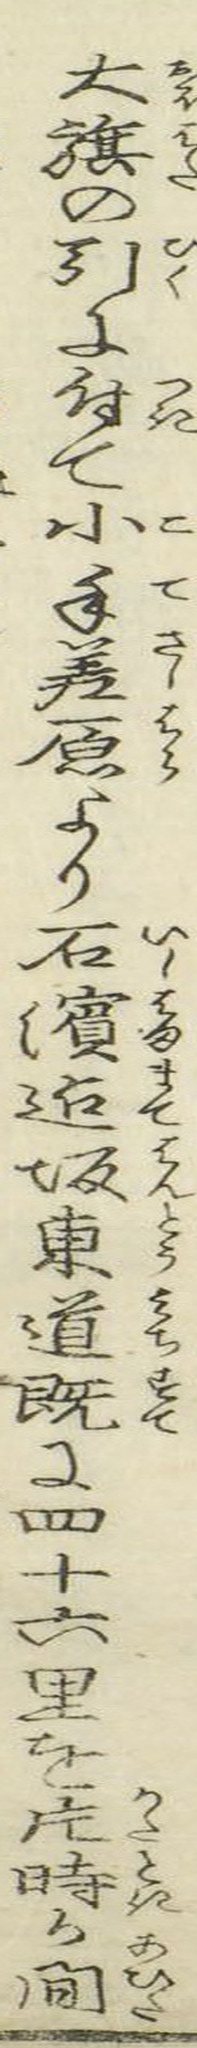大旗の引に付て小手指原より石浜迄坂東道既に四十六里を片時か間

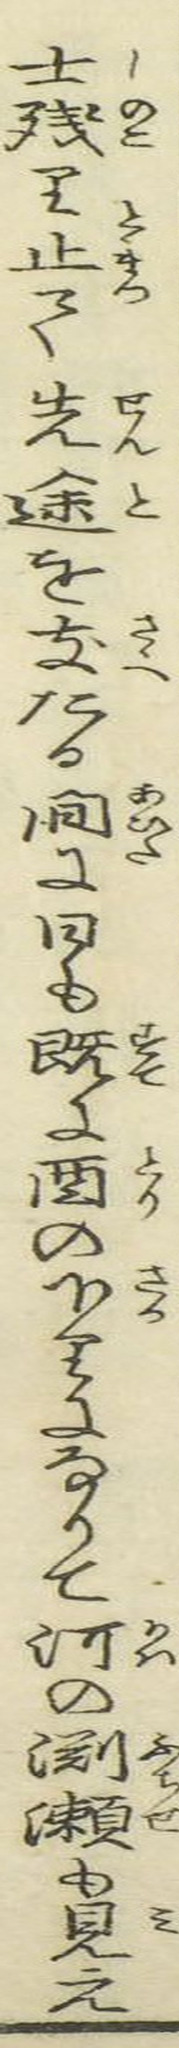士残り止て先途を支たる間に日も既に酉の下りになりて河の渕瀬も見え
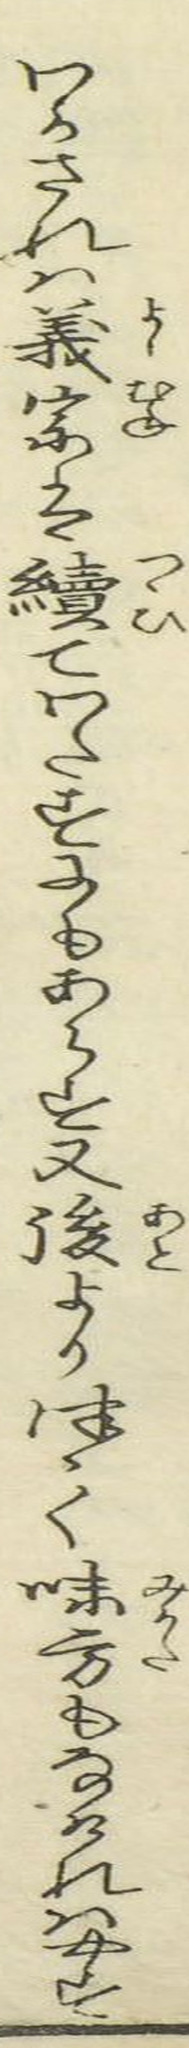わかされは義宗は続てわたすにもあらす又後よりつゝく味方もなけれはやす
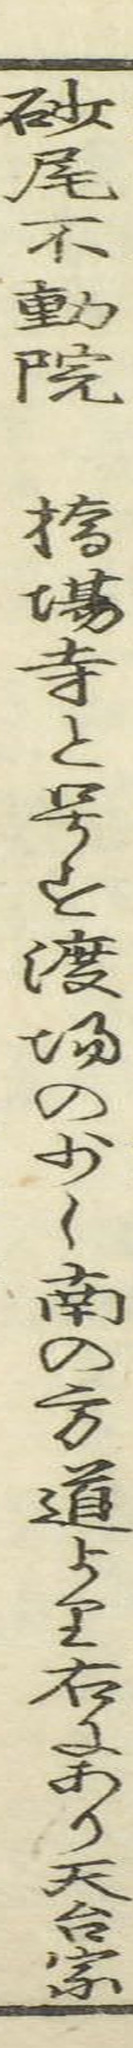砂尾不動院橋場寺と号す渡場の少し南の方道より右にあり天台宗
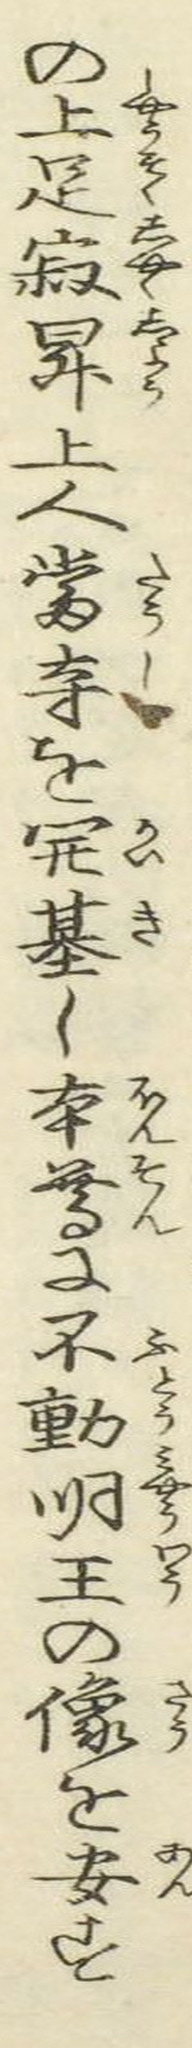の上足寂昇上人当寺を開基し本尊に不動明王の像を安す
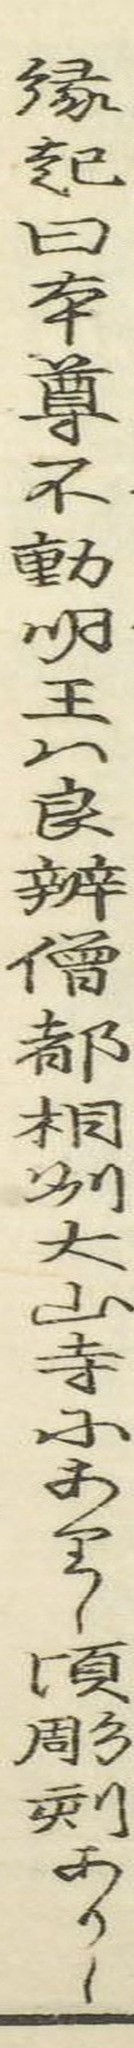縁起曰本尊不動明王は良弁僧都相州大山寺にありし頃彫刻ありし
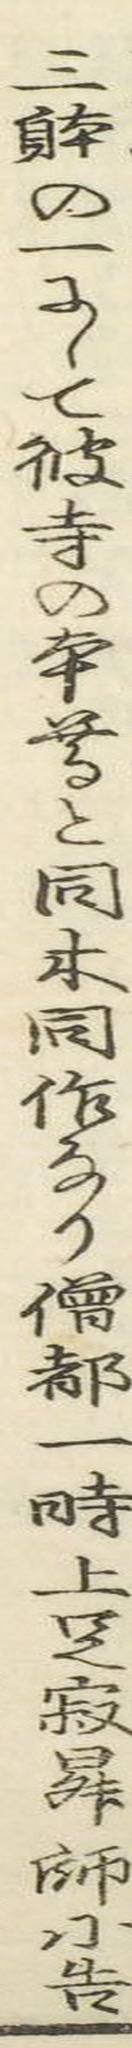三体の一にして彼寺の本尊と同木同作なり僧都一時上足寂昇師に告
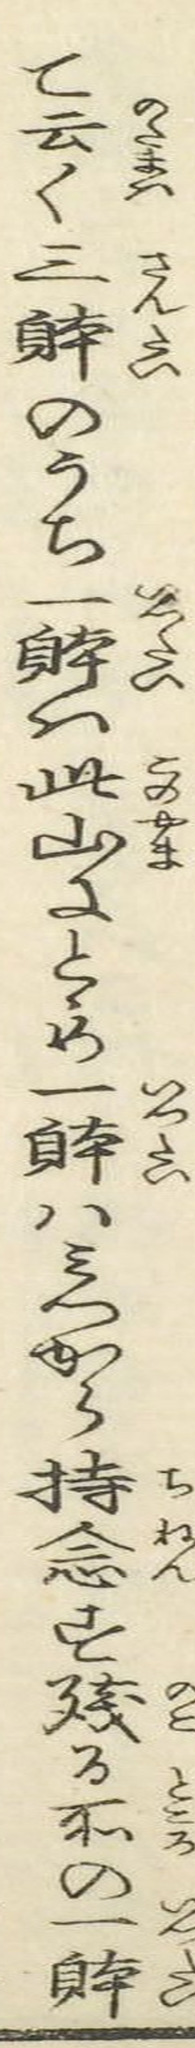て云く三体のうち一体は此山にとゝめ一体はみつから持念す残る所の一体
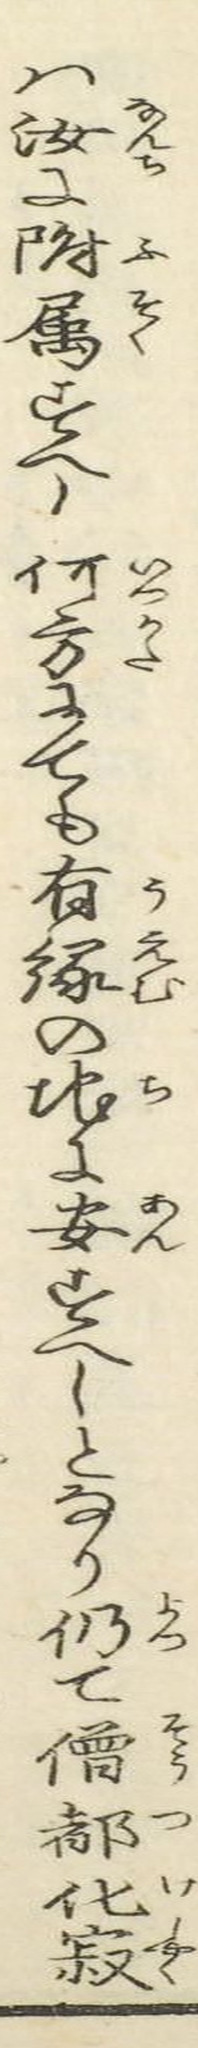は汝に附属すへし何方にても有縁の地に安すへしとなり仍て僧都化寂
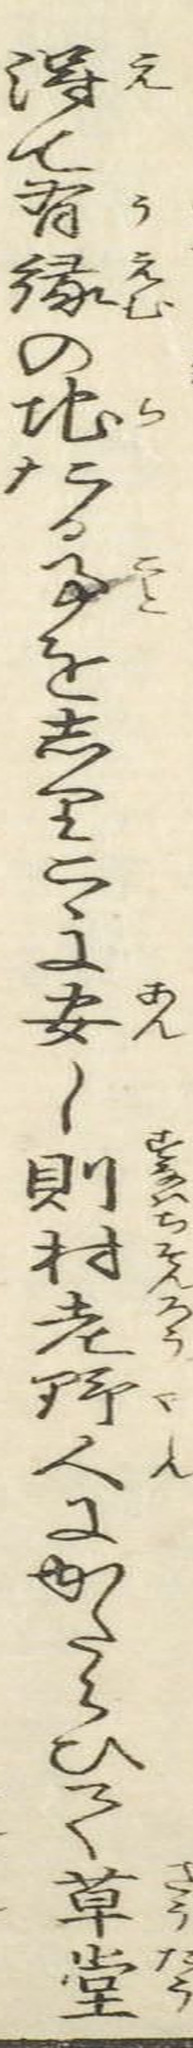得て有縁の地たる事をしりこゝに安し則村老野人にかたらひて草堂
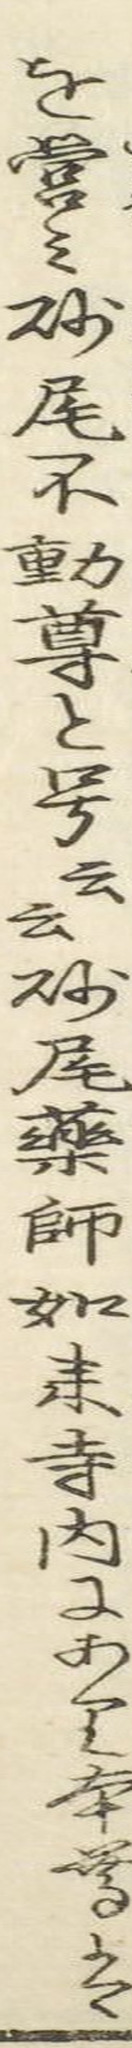を営み砂尾不動尊と号云云砂尾薬師如来寺内にあり本尊は
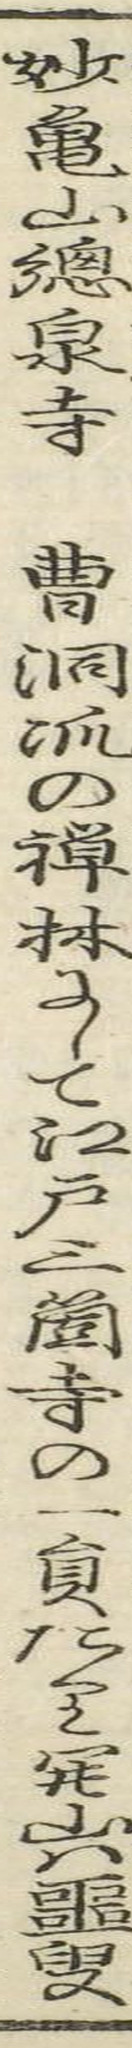妙亀山総泉寺曹洞派の禅林にして江戸三箇寺の一員たり開山は噩叟
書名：江戸名所図会 20巻 巻之17
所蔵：東京学芸大学教育コンテンツアーカイブ
